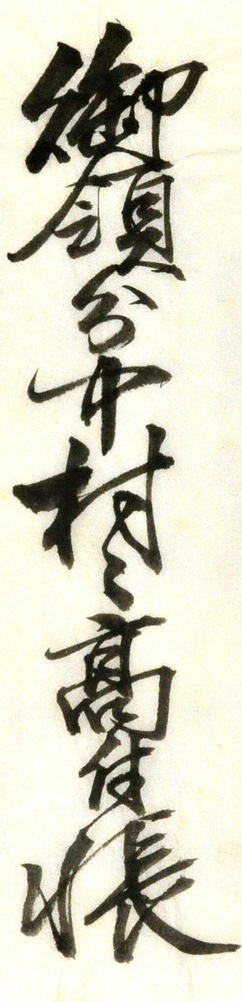御領分中村々高付帳

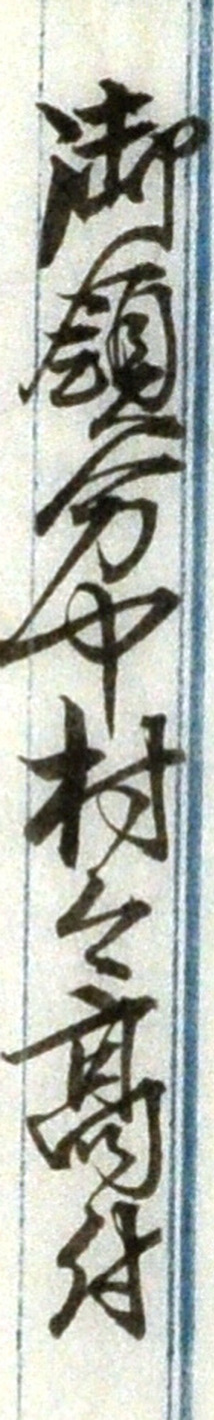御領分中村々髙付
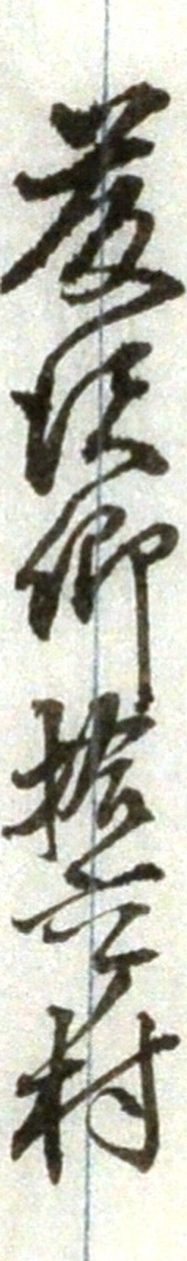藤沢郷拾六ヶ村

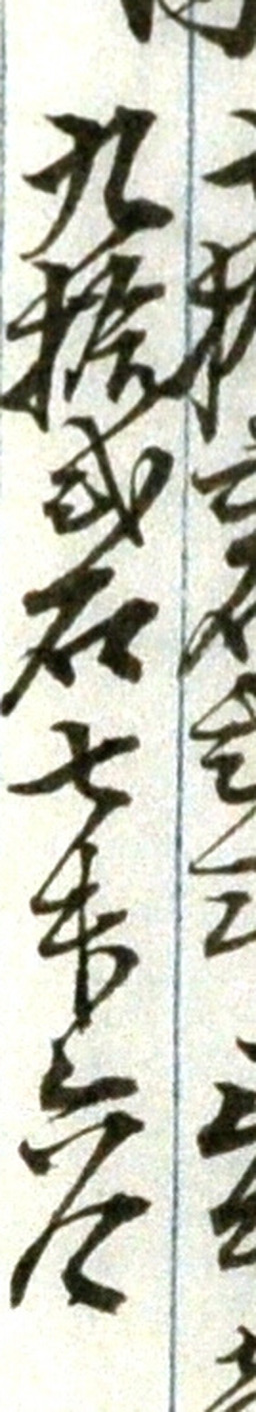九拾弐石七升六合畑方

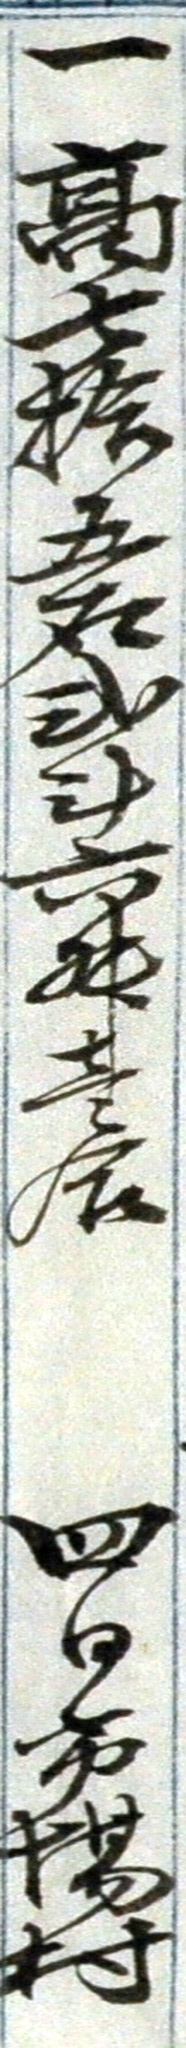一高七拾五石弐斗六升壱合下四日市場村
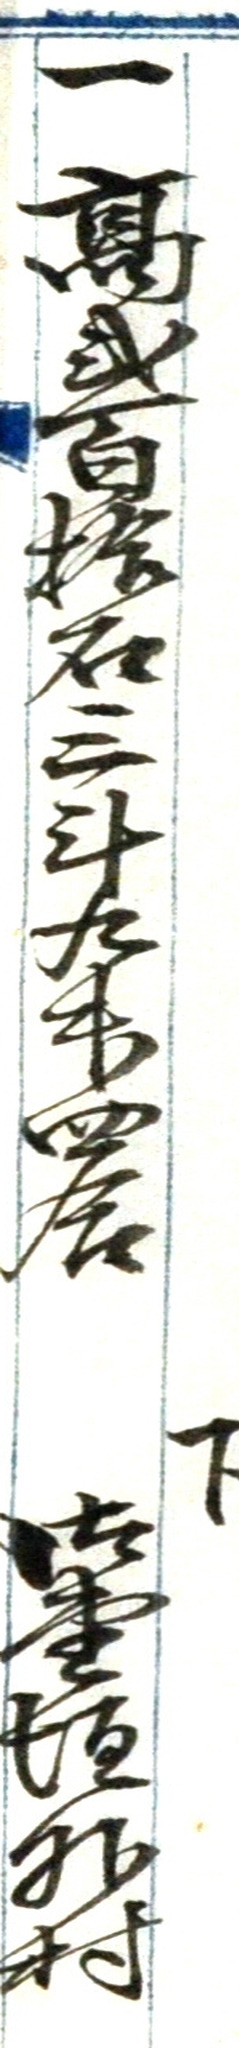一高弐百拾石三斗九升四合下御堂垣外村

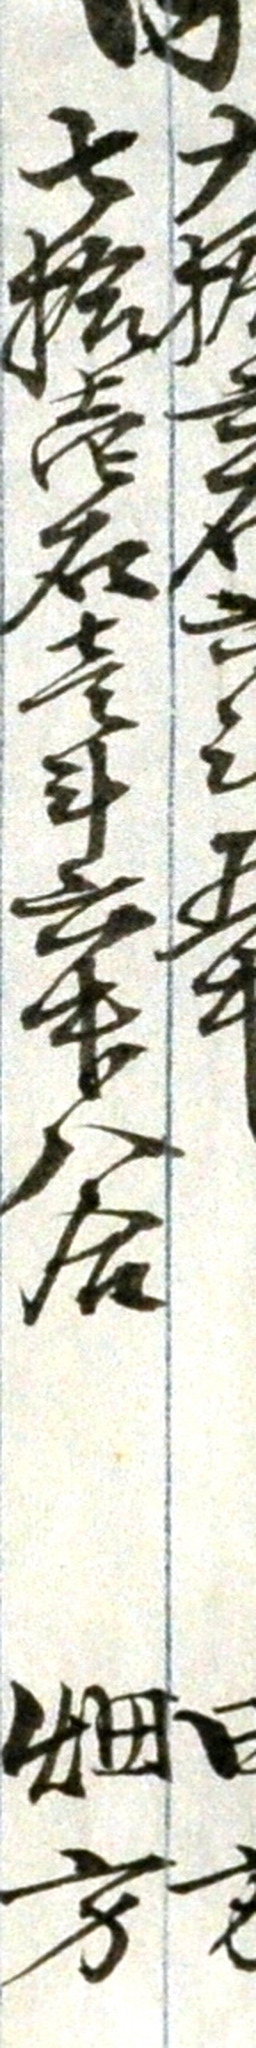七拾壱石壱斗六升八合畑方
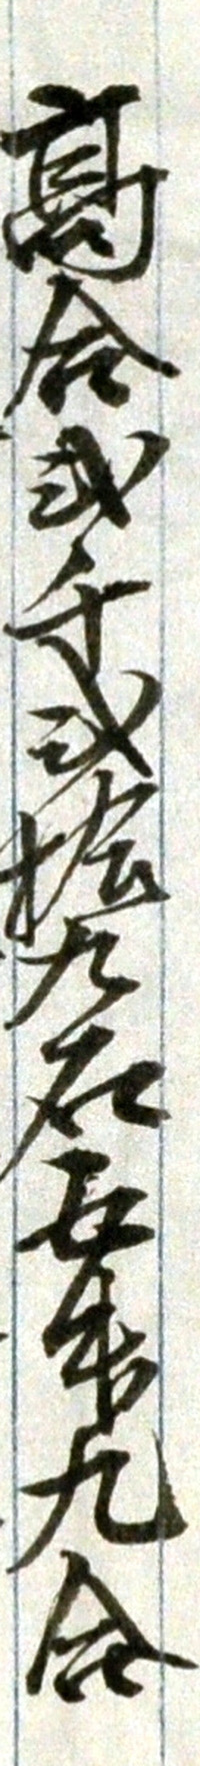高合弐千弐拾九石五升九合
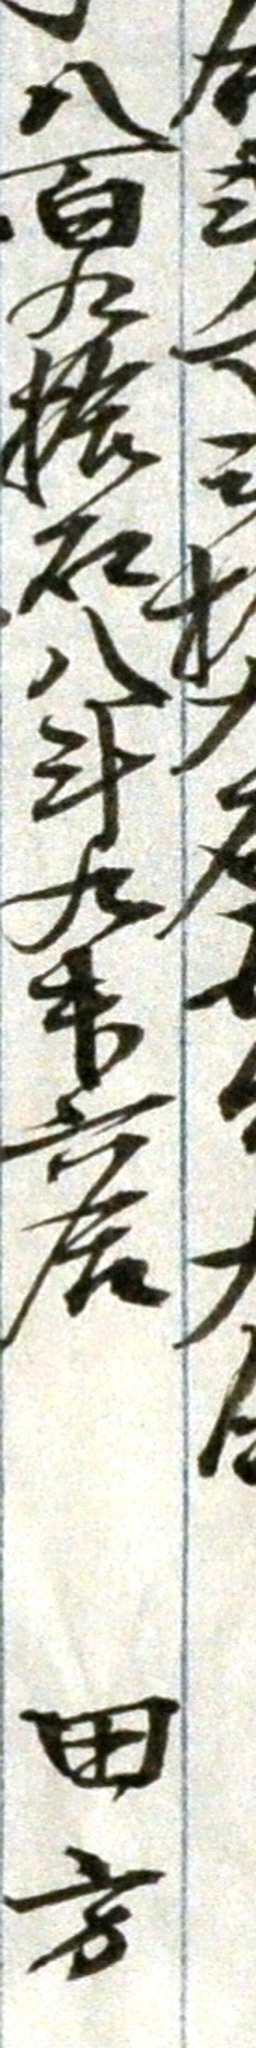内八百九拾石八斗九升六合田方
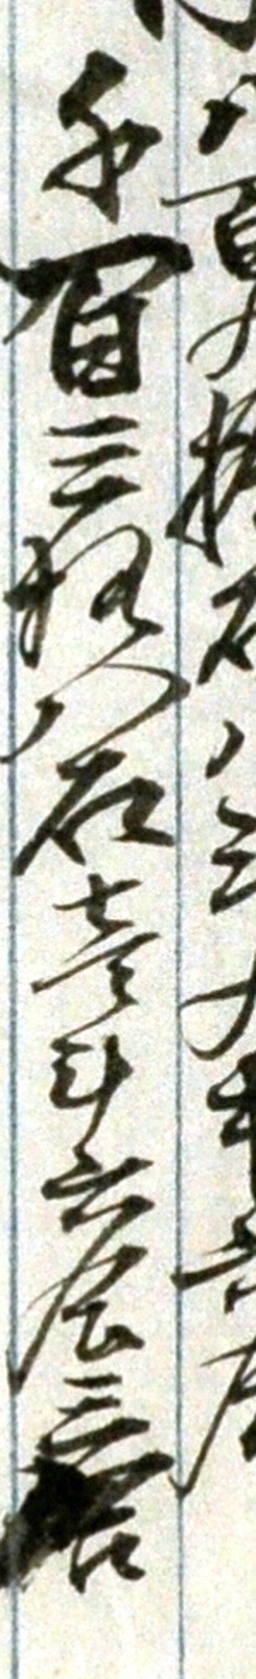千百三拾八石壱斗六合三合畑方
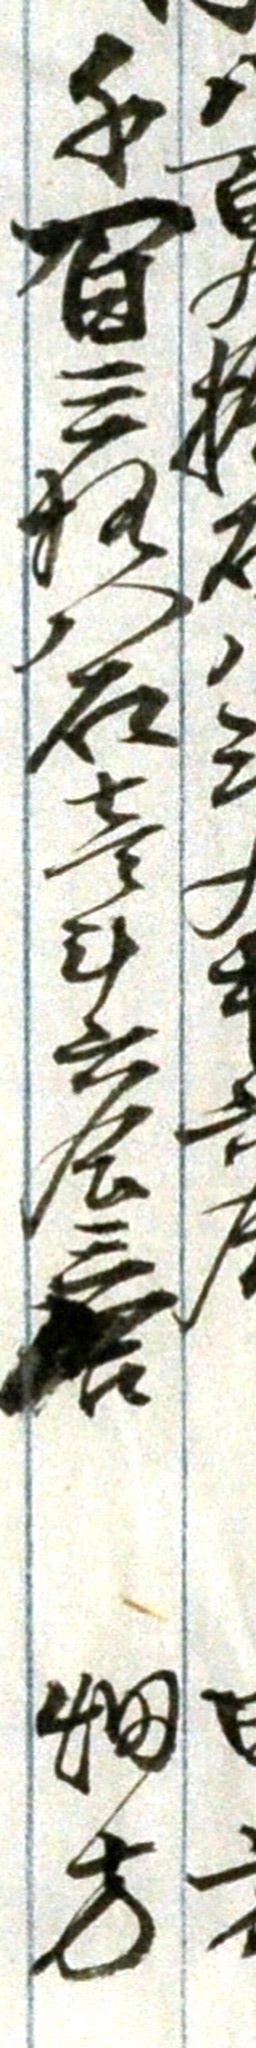千百三拾八石壱斗六合三合畑方
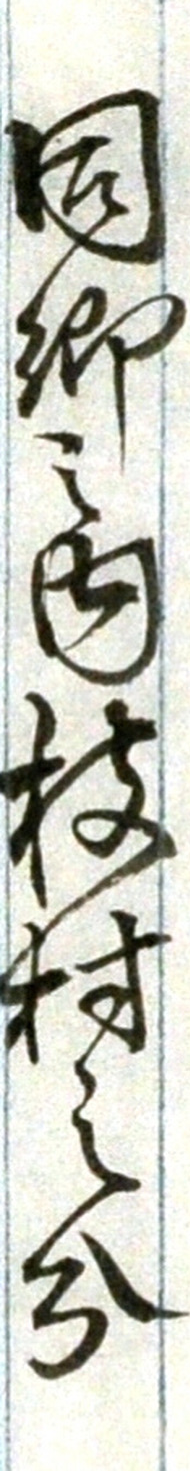同郷之内枝村之分

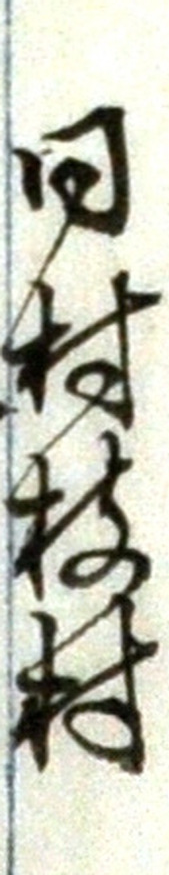同村枝村
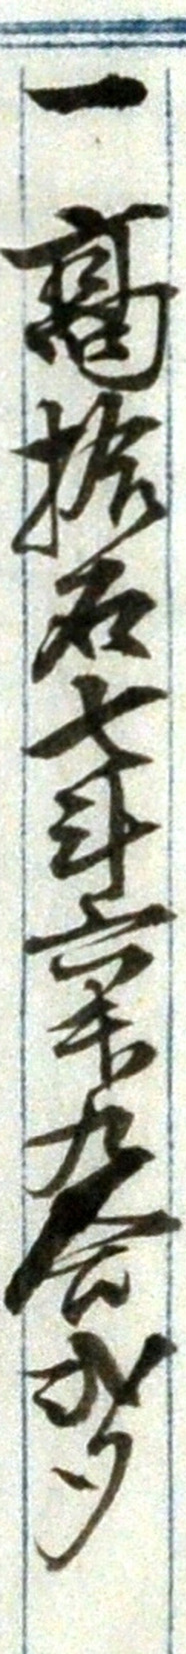一高拾石七斗六升九合弐勺土橋
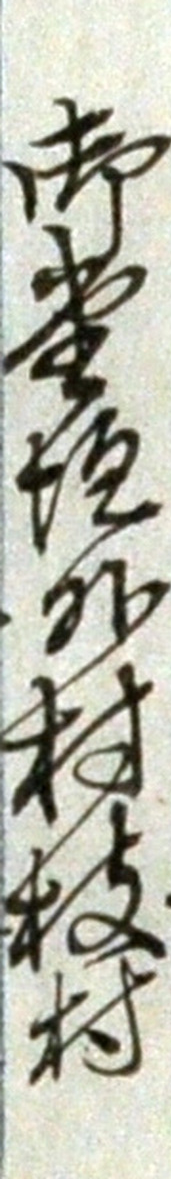御堂垣外村枝村
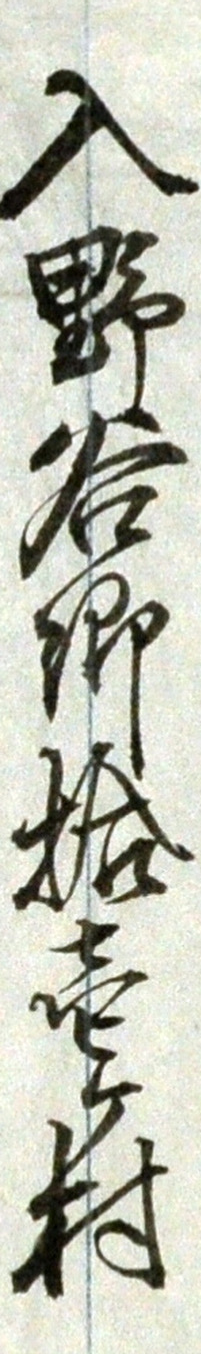入野谷郷拾壱ケ村
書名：御領分中村々高付帳
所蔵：伊那市立高遠町図書館・合同会社AMANE
